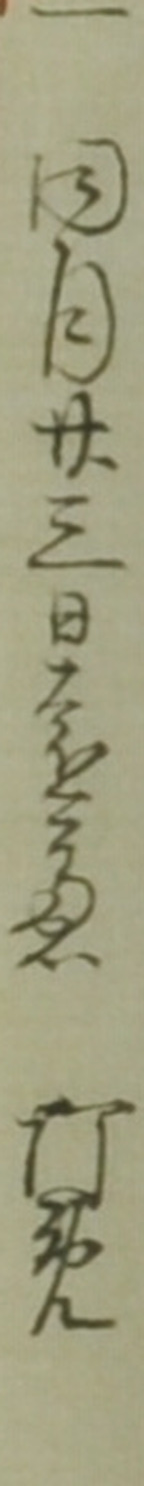一同月廿三日遠慮御免
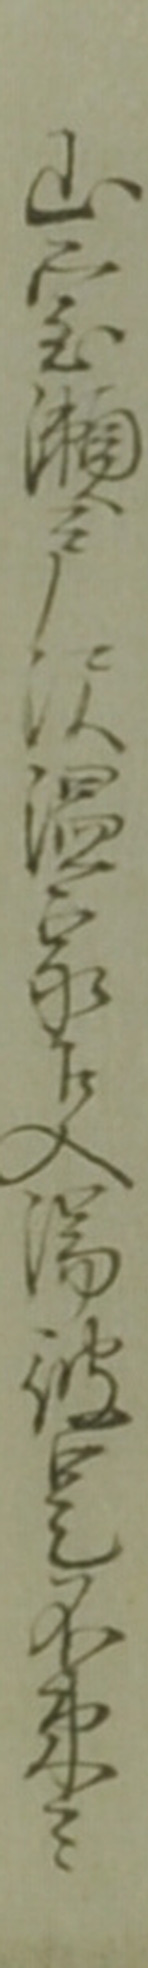山室瀬戸沢温泉江入湯彼是不束之
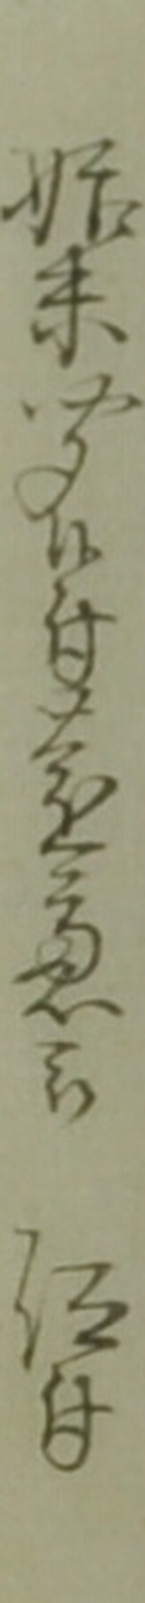始末聞候二付遠慮被仰付

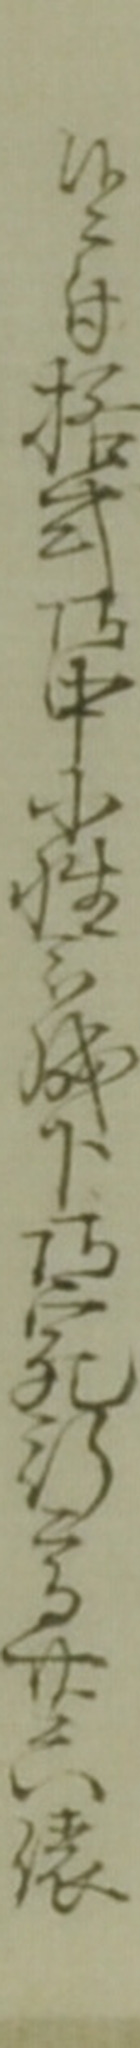候ニ付格式御中小性被成下御宛行高廿六俵
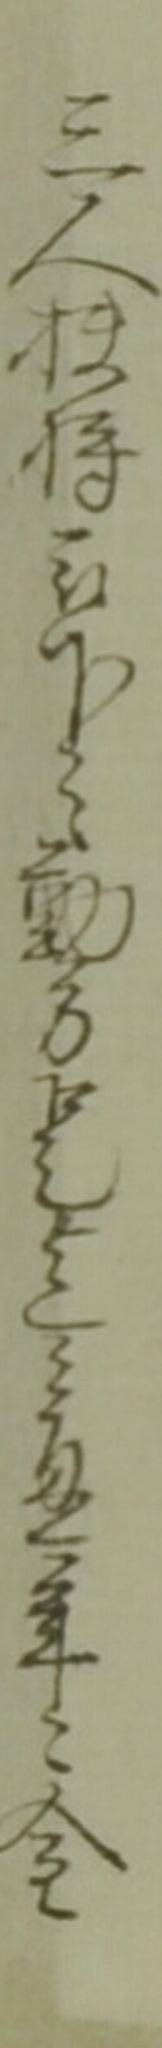三人扶持被下之勤方是迄之通年々金
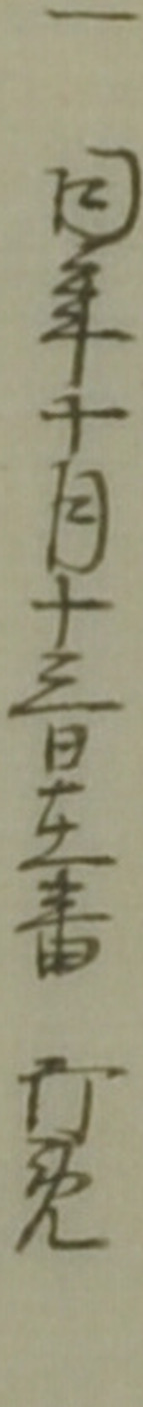一同年十月十三日在番御免

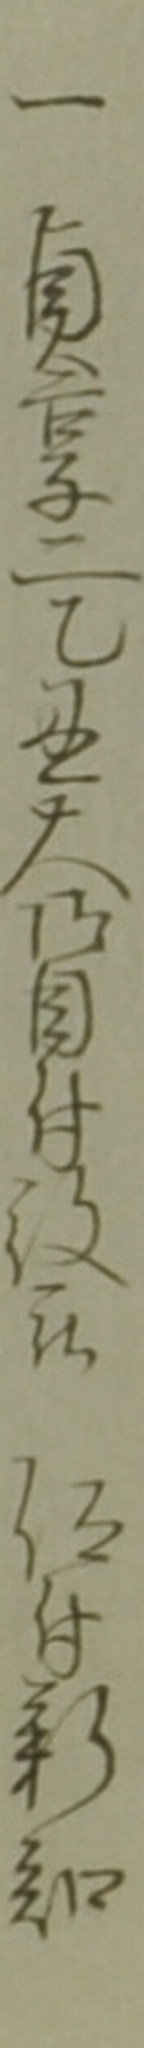一貞享二乙丑大御目付役被仰付新知
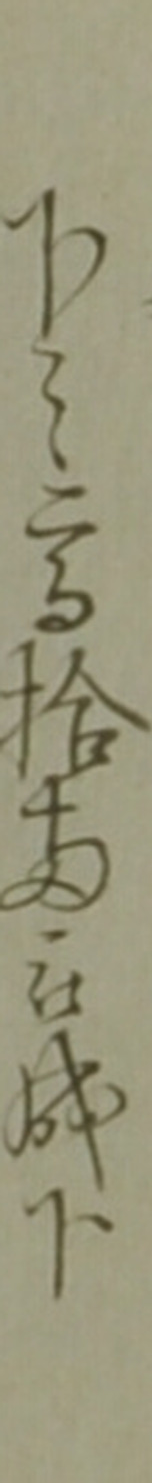下之高拾両被成下
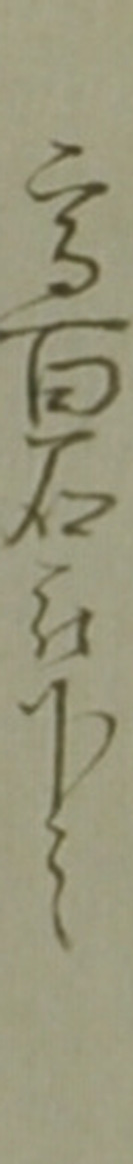高百石被下之

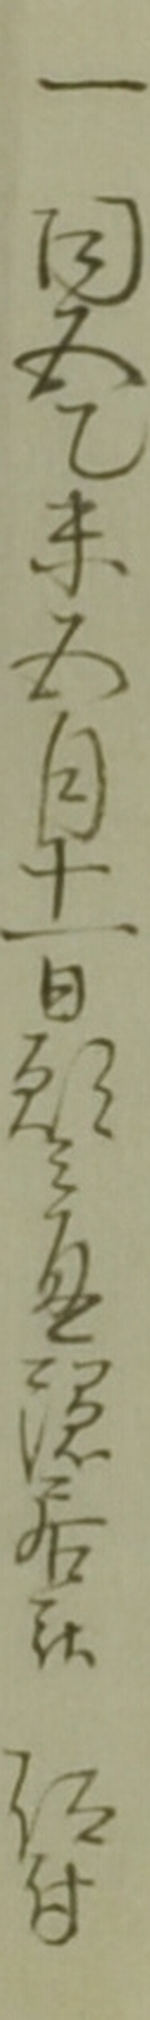一同五乙未五月十一日願之通隠居被仰付
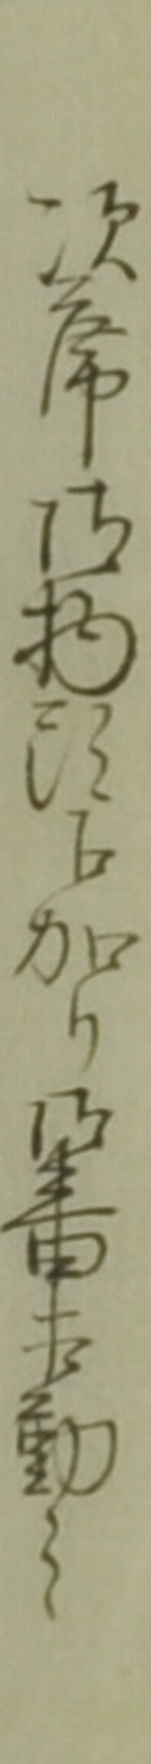次席御物頭江加り御番相勤之
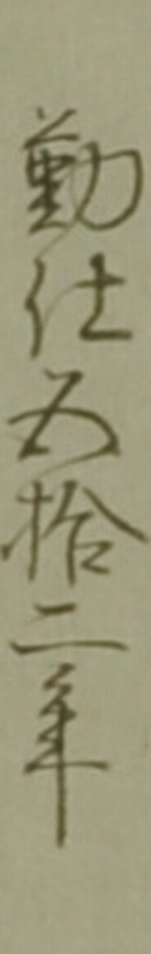勤仕五拾二年
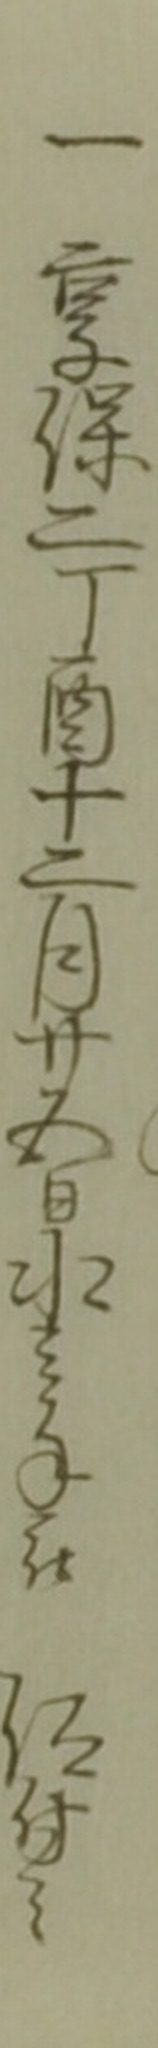一享保ニ丁酉十二月廿五日水之手被仰付之
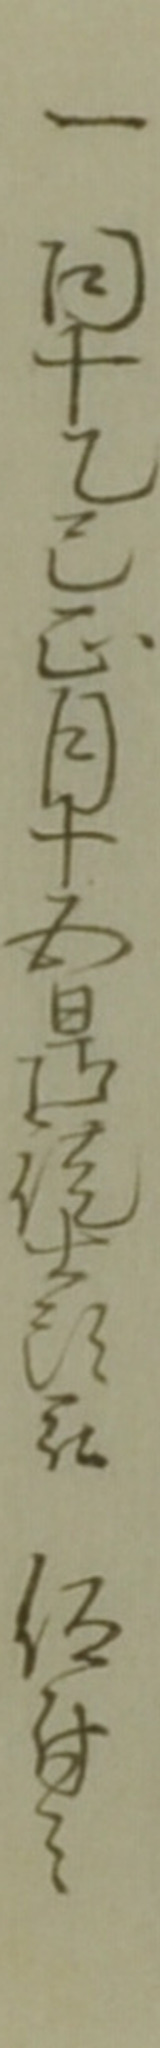一同十乙巳正月十五日御徒士頭被仰付之
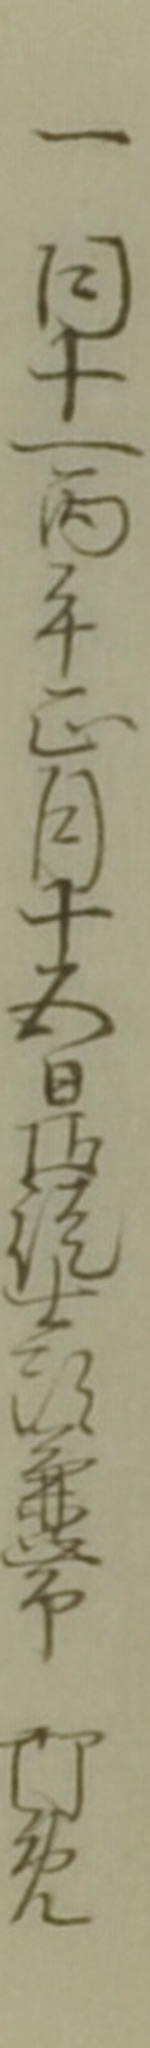一同十一丙午正月十五日御徒士頭兼帯御免
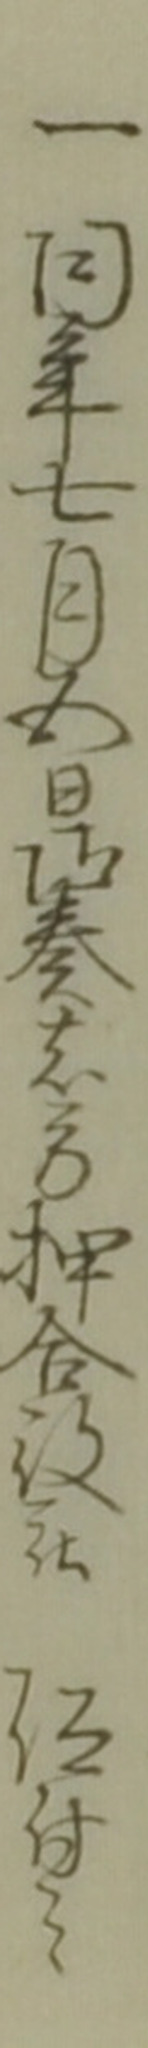一同年七月五日御奏者方押合役被仰付之
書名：給人諸士勤仕録（三）
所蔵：伊那市立高遠町図書館・合同会社AMANE
